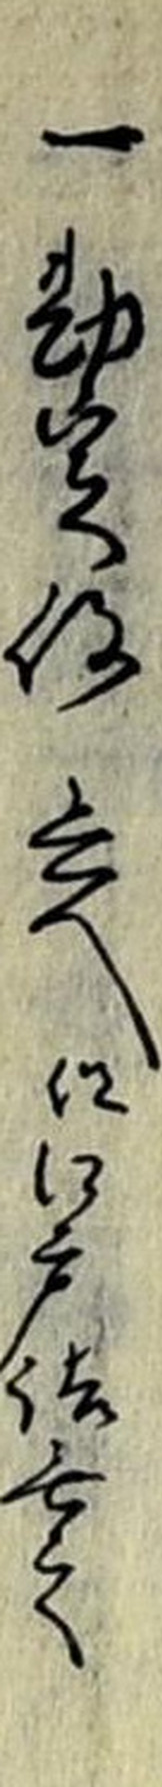一勘定役壱人但江戸詰無之
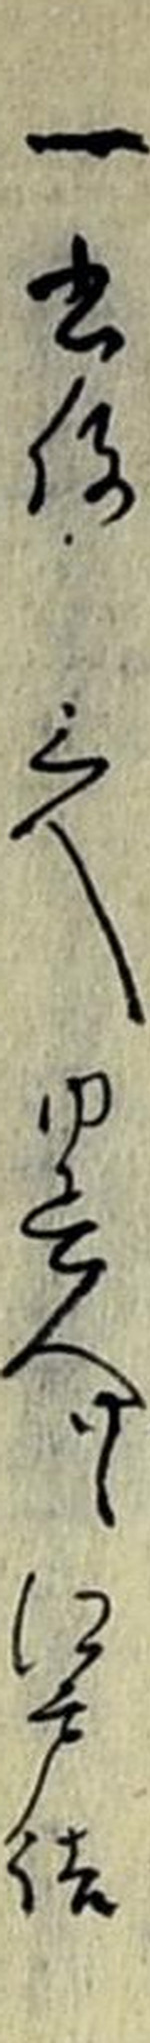一書役三人内壱人ツヽ江戸詰
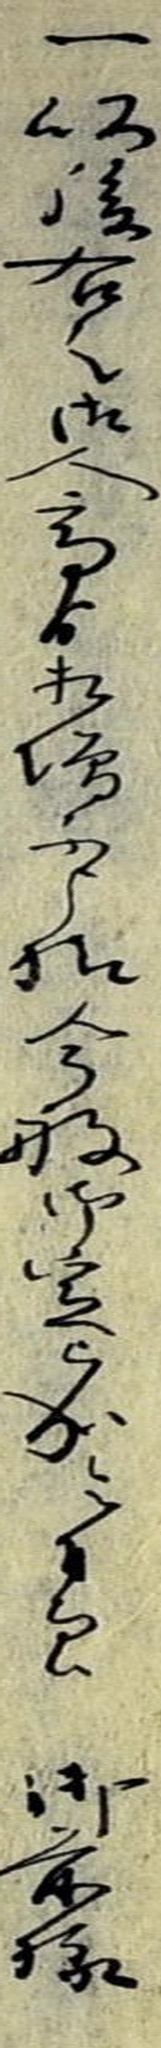一以後右之御人高ゟ相増不申様今般御定被成候に付而は御前様
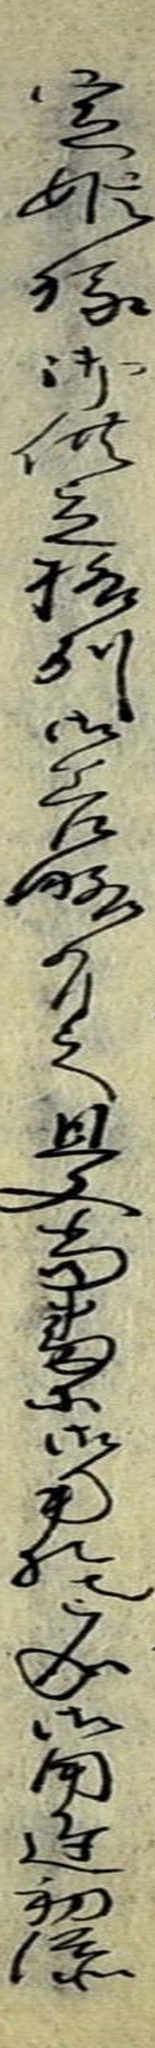定姫様御供立格別御差略有之且又当番等御用捨被成御用達初添
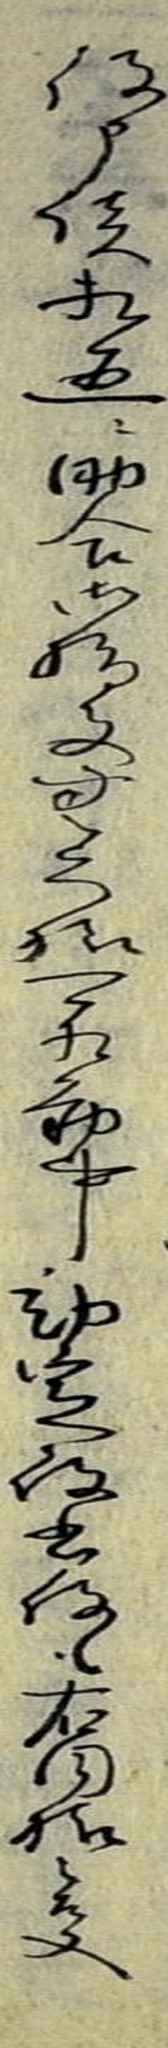役申談相互に助合御指支無之様可相勤事勘定役書役も右同様之事
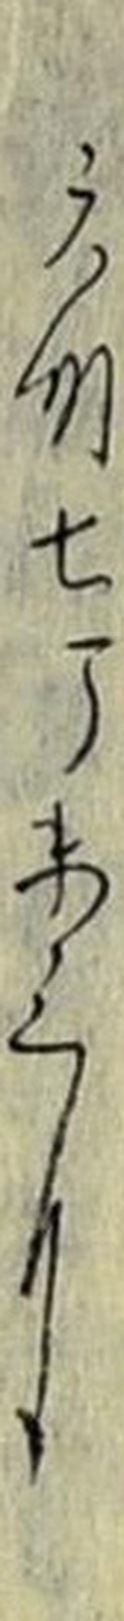天明七丁未三月
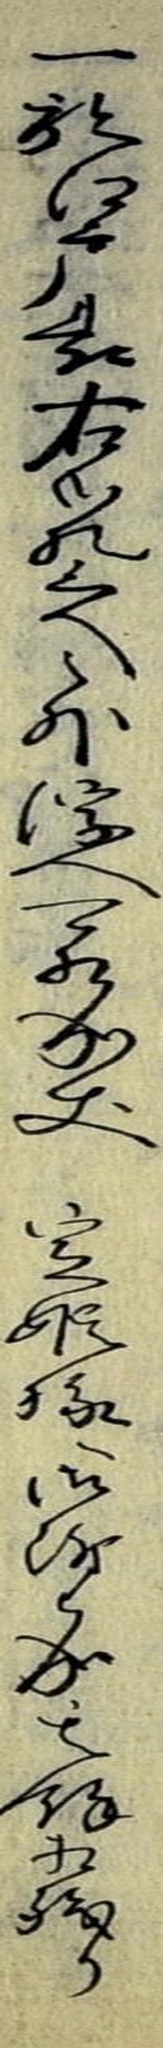一於江戸表右弐拾三人之外浮人可相成丈定姫様へ御附被成其余相残り
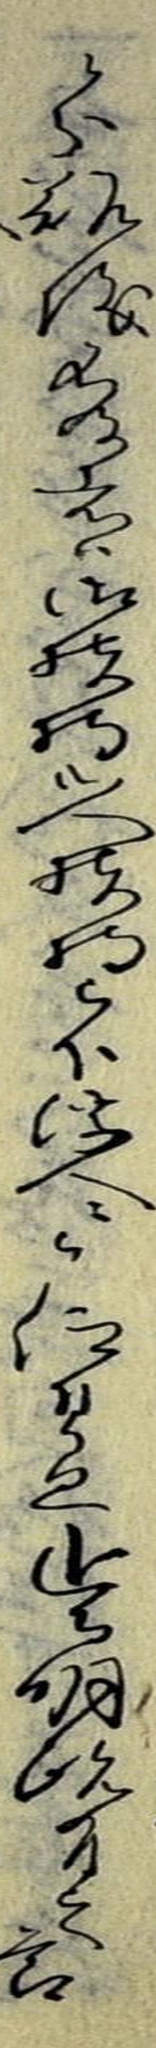候分難儀不及者は御扶持弐人扶持被下浮人に被仰付置追而明跡有之節
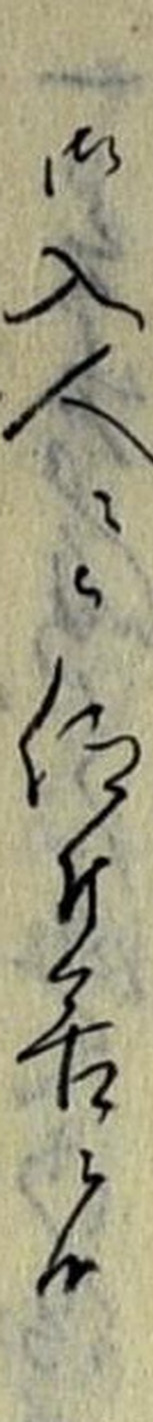御入人に被仰付筈に候
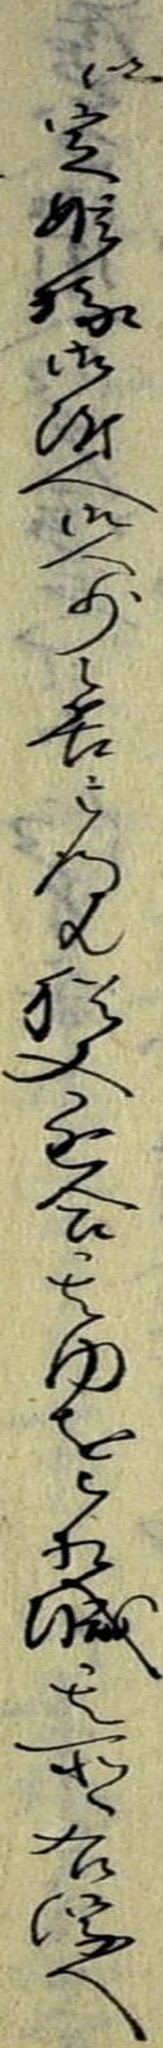但定姫様御附人御人少之筈に候得共猶又懸合其内を被相減其所へ右浮人
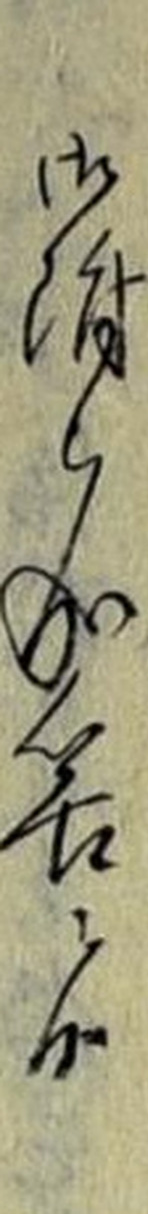御附被成筈に候
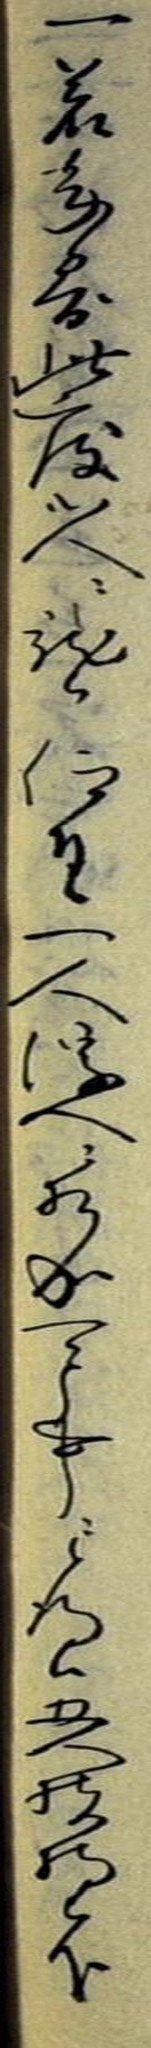一若年寄此度弐人に就被仰付候一人浮人に相成可申事に候得は五人扶持被下
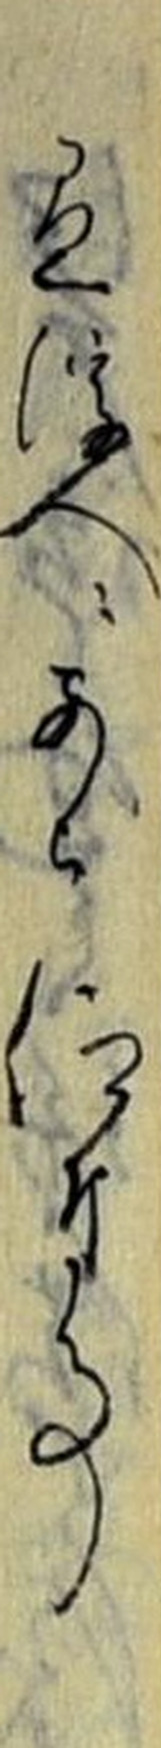置浮人に可被仰付事
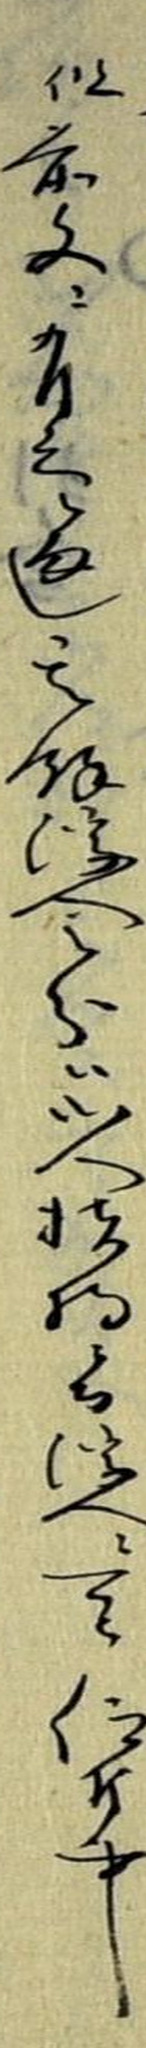但前文に有之候通其余浮人之分は弐人扶持に而浮人に可被仰付事
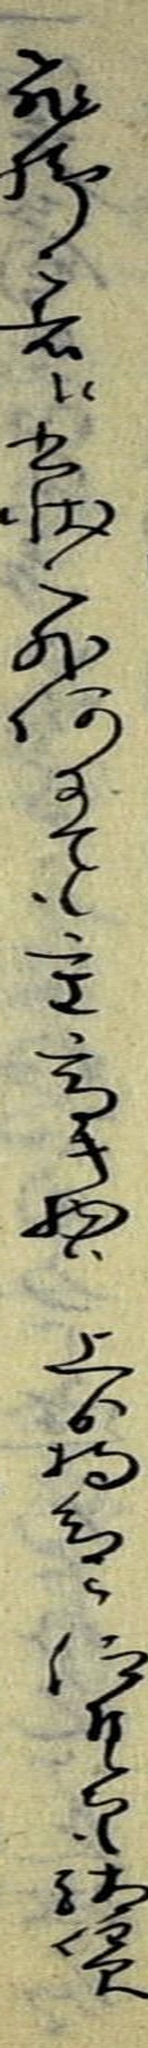飛脚之者え書状之外何にても重高き物は上ゟ持参被仰付候而も駄賃
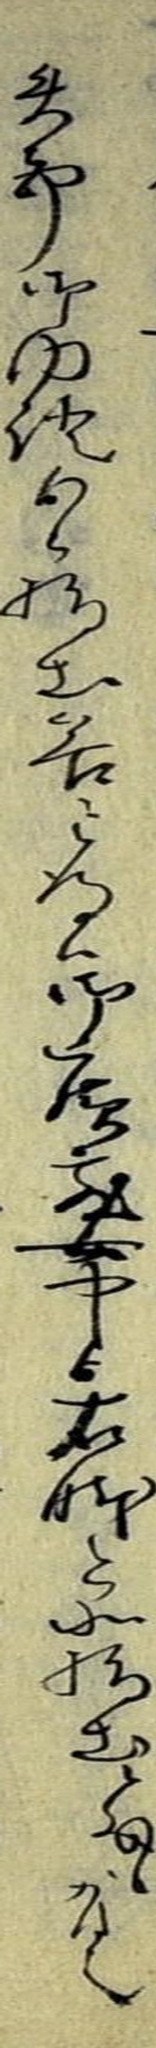失却御内証ゟ被指出筈に候得は御広敷女中ゟ右躰之品指出候義も有之
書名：命令之部 二
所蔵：福井県文書館 Fukui Prefectural Archives
